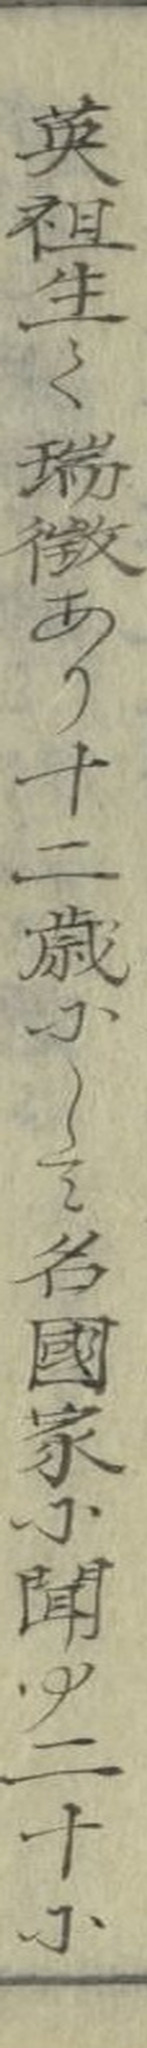英祖生て瑞徴あり十二歳にして名国家に聞ゆ二十に
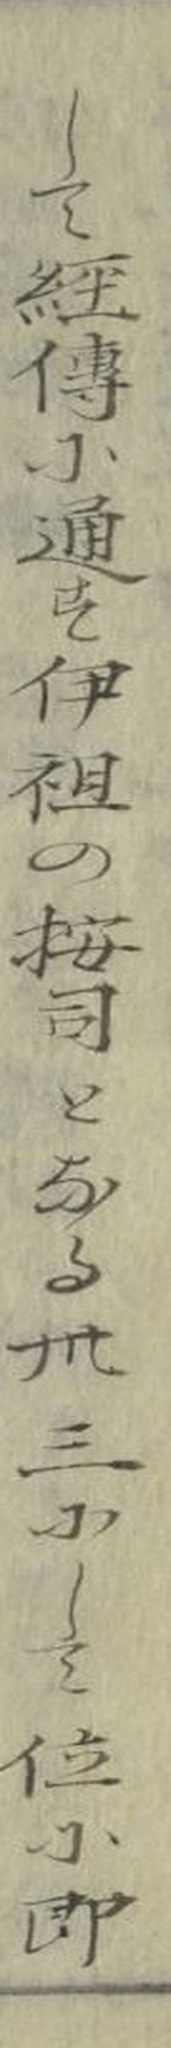して経伝に通す伊祖の按司となる卅三にして位に即
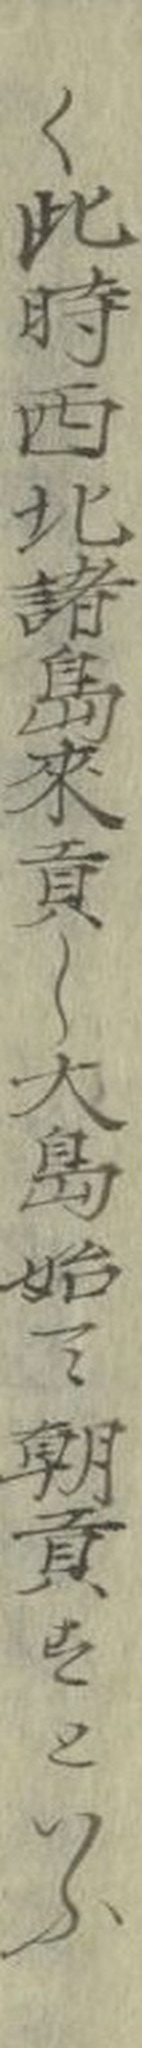く此時西北諸島来貢し大島始て朝貢すという
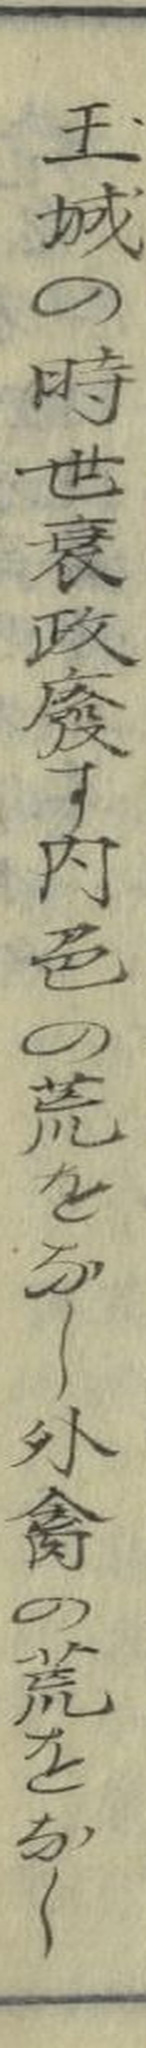玉城の時世衰政廃す内色の荒をなし外禽の荒をなし
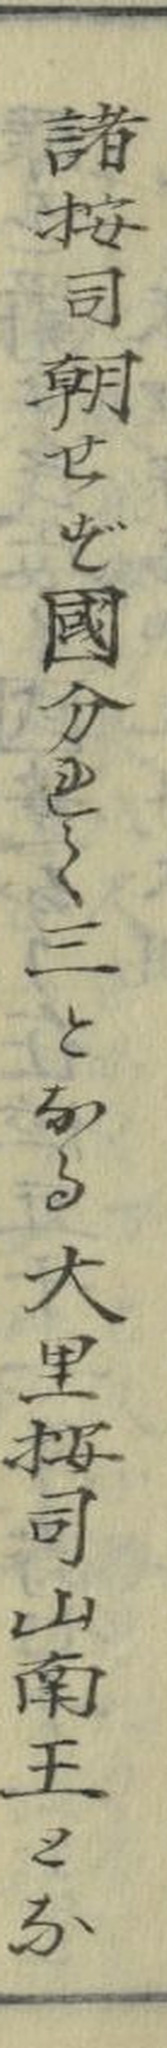諸按司朝せず国分れて三となる大里按司山南王とな
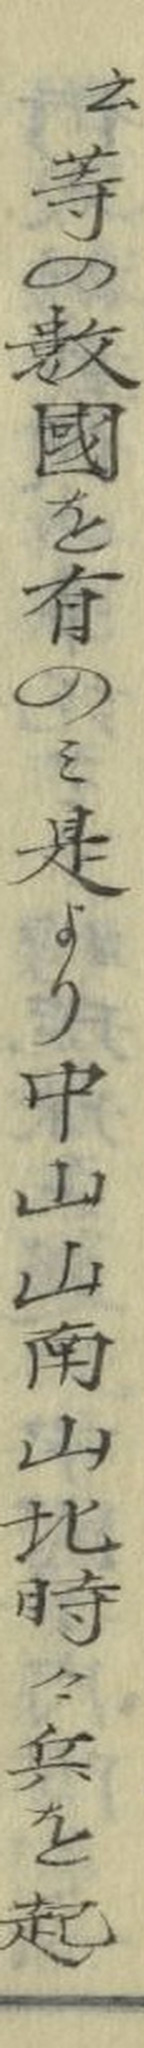云等の数国を有のみ是より中山山南山北時々兵を起
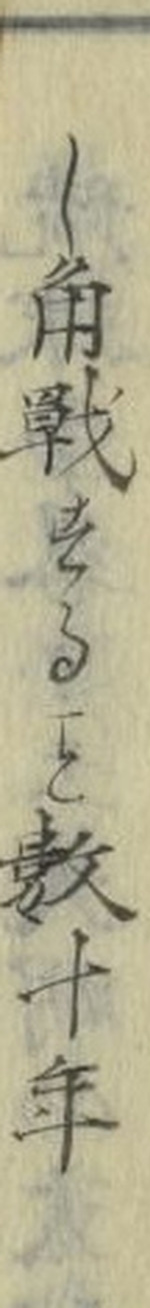し角戦すること数十年
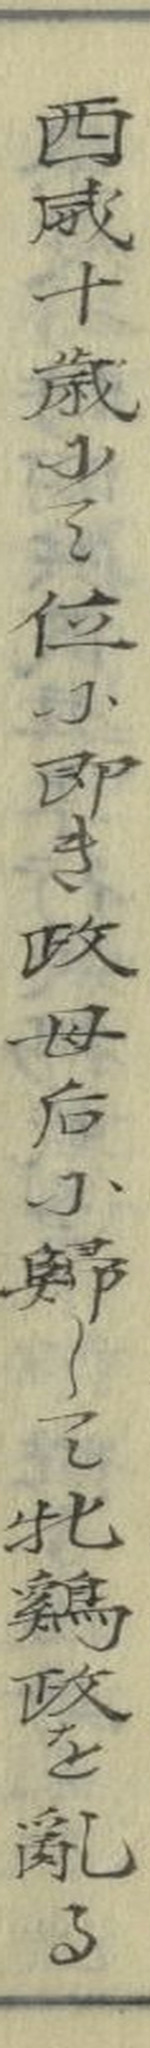西威十歳にて位に即き政母后に帰して牝鶏政を乱る
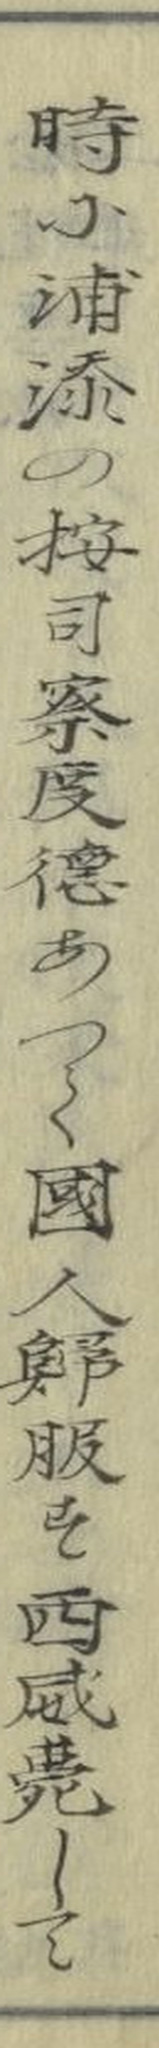時に浦添の按司察度徳あつく国人帰服す西威斃して
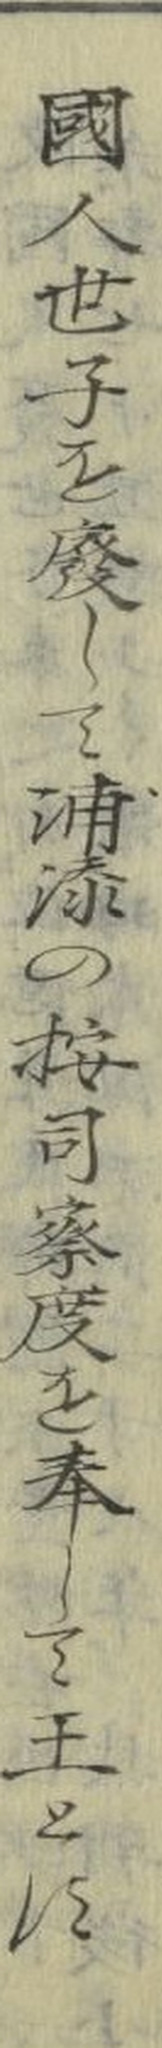国人世子を廃して浦添の按司察度を奉して王とす
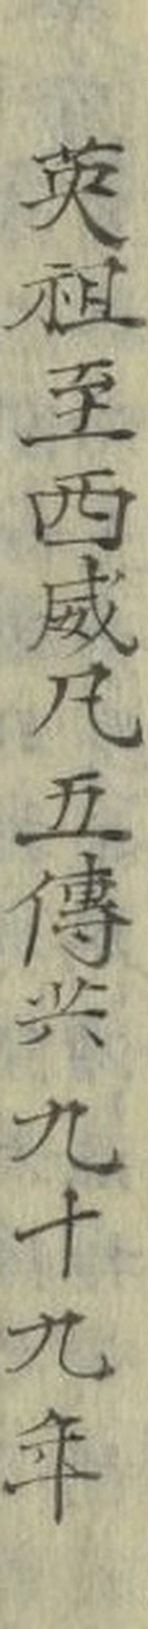英祖至西威凡五伝共九十九年

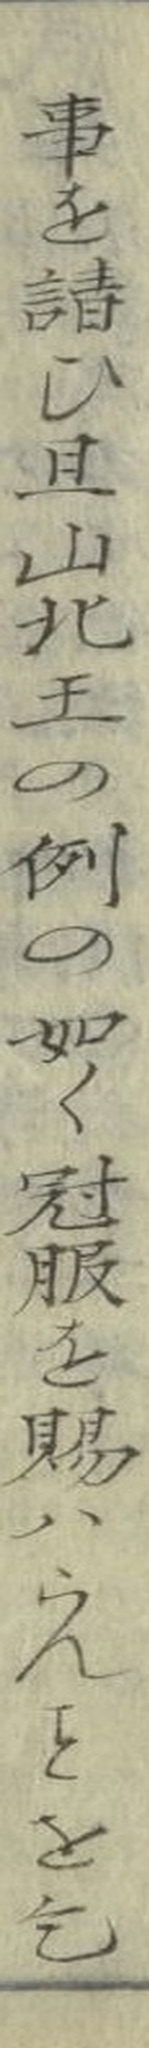事を請ひ且山北王の例の如く冠服を賜はらんことを乞
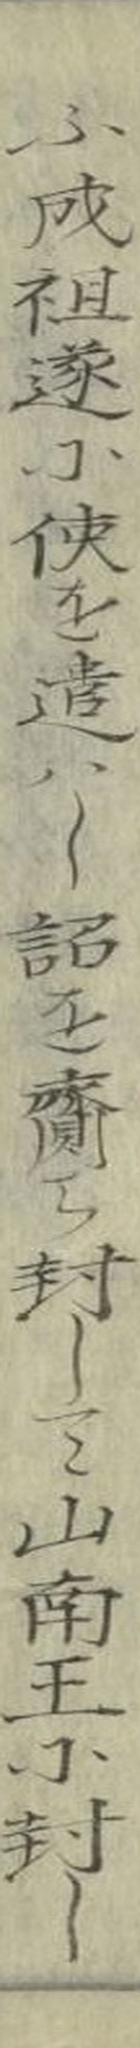ふ成祖遂に使を遣はし詔を齎て封して山南王に封し
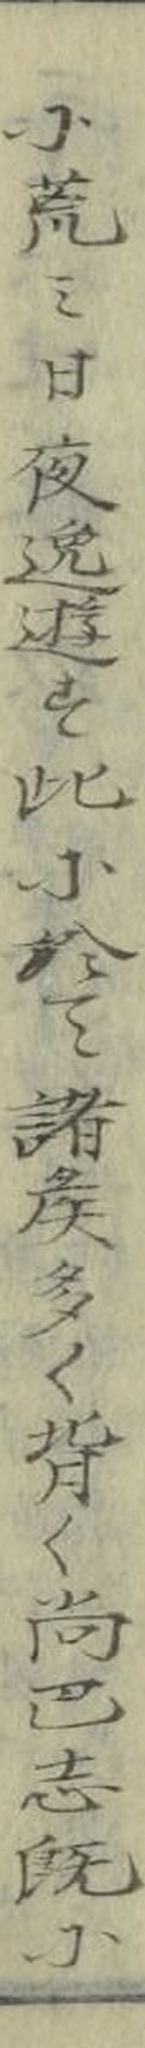に荒み日夜逸遊す此に於て諸侯多く背く尚巴志既に
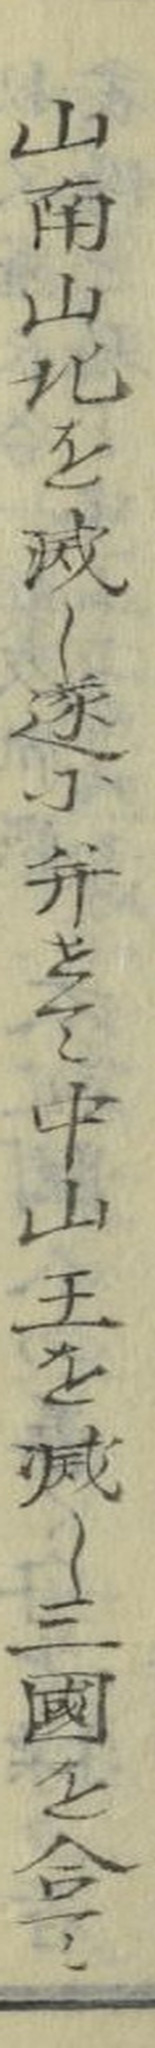山南山北を滅し遂に并せて中山王を滅し三国を合て
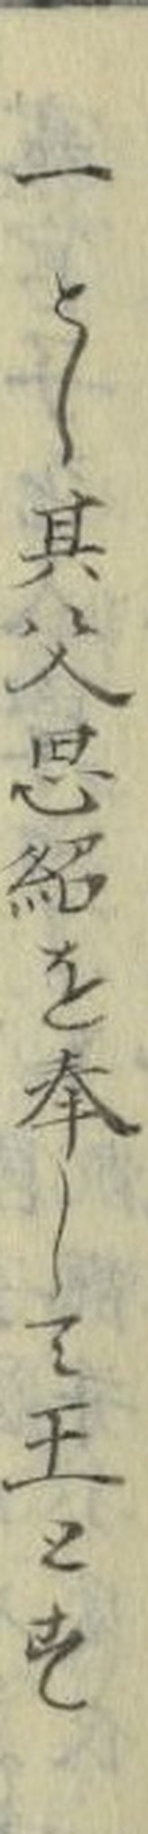一とし其父思紹を奉して王とす
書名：琉球沿革志 下
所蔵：University of the Ryukyus Library
